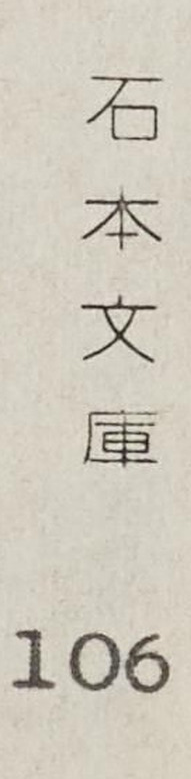石本文庫
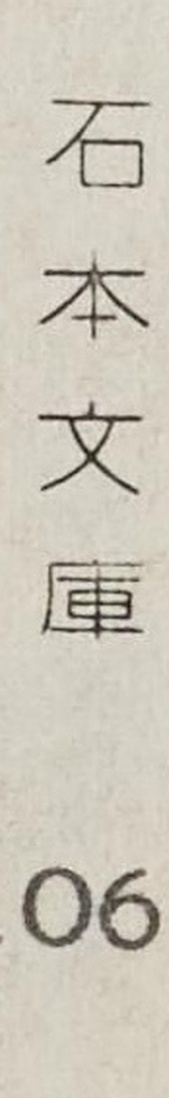石本文庫
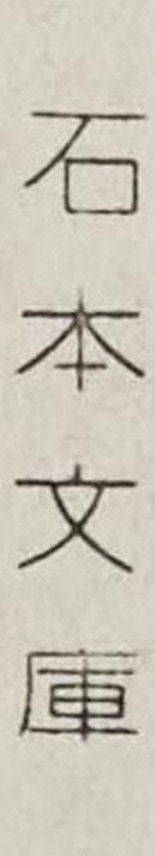石本文庫

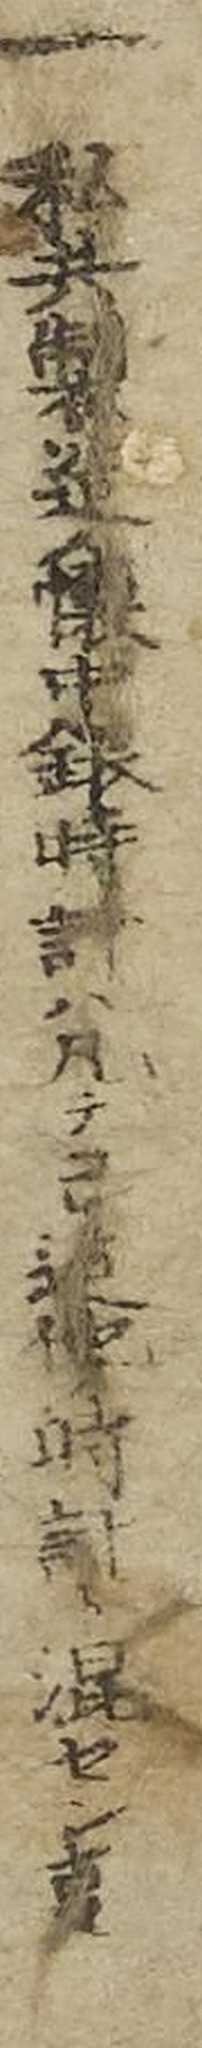一私共製造ノ懐中銀時計ハ凡テコレ迄他ノ時計ト？混セン事
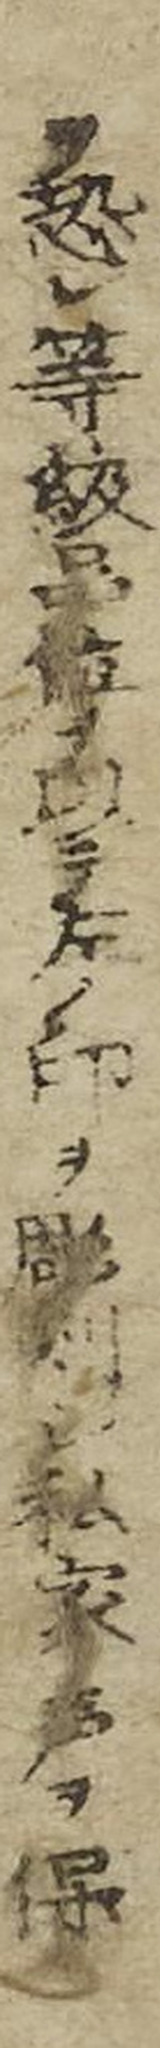ヲ恐レ等級品位ヲ以テ左ノ印ヲ彫刻シ私家ノ？声ヲ保
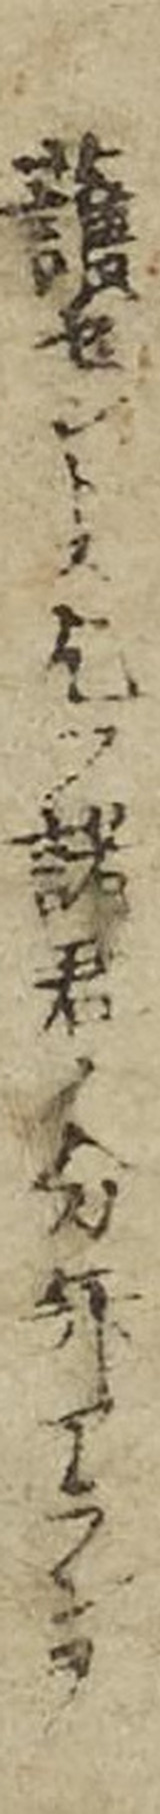護セント乞フ諸君ノ分弁アランヲ

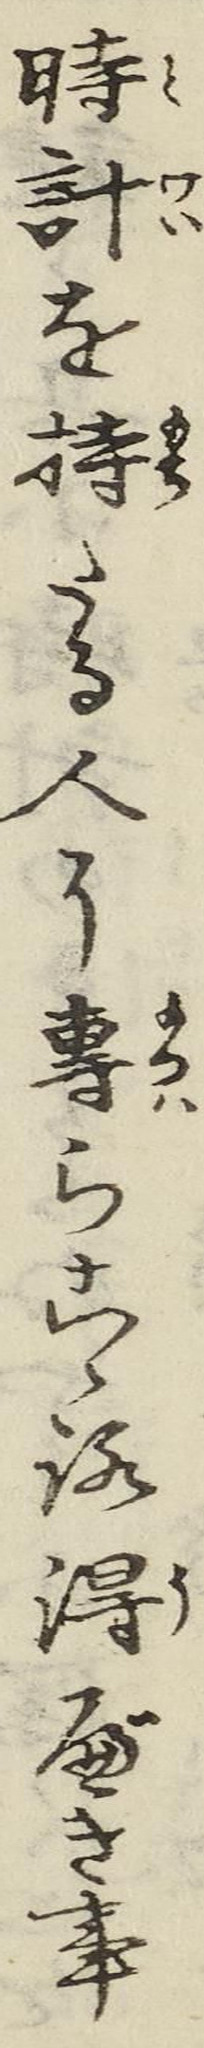時計を持たる人に専らこゝろ得べき事
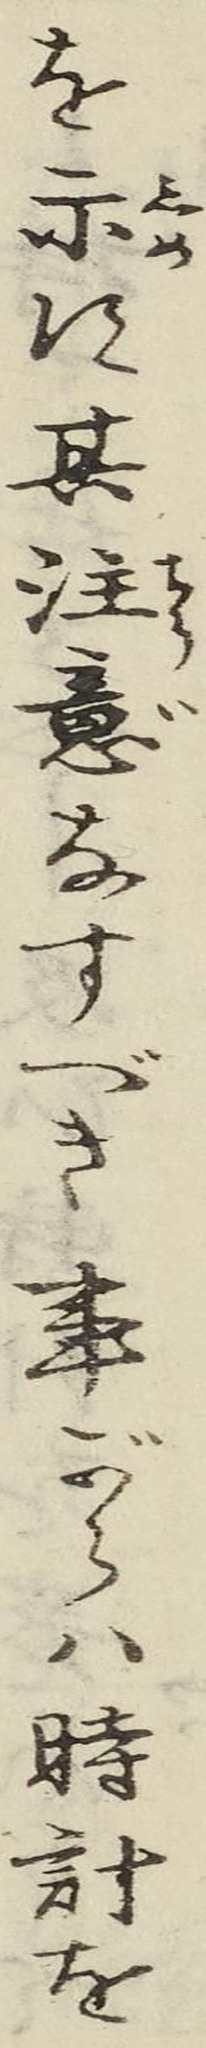を示す其注意なすべき事がらは時計を
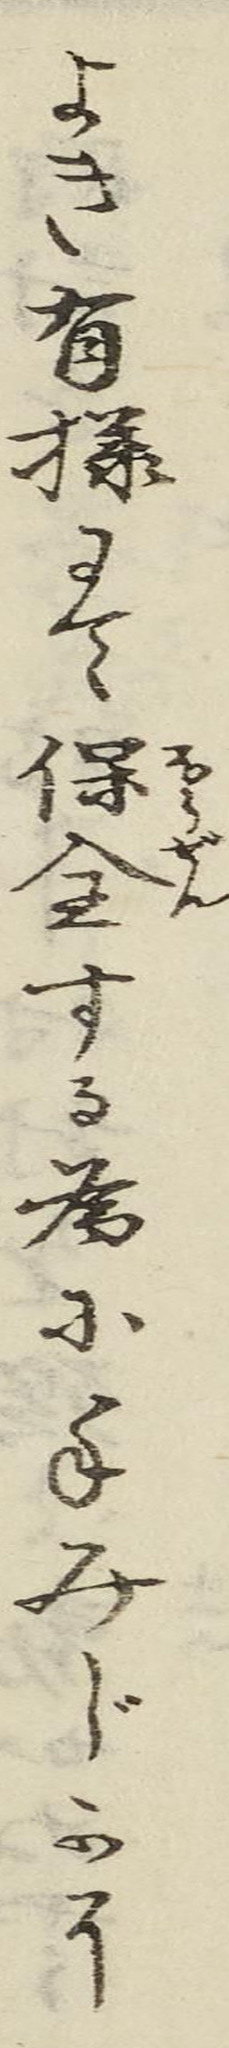よき有様にて保全する為に手みじかに
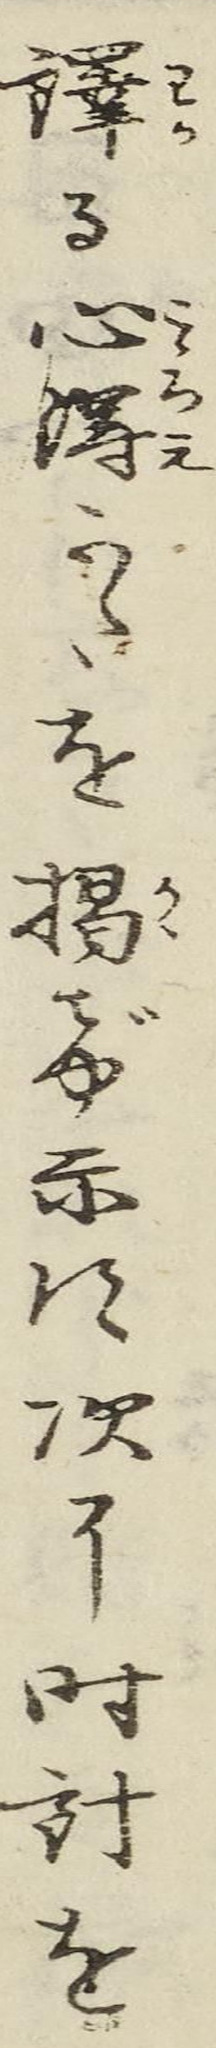訳る心得かたを掲げ示す次に時計を
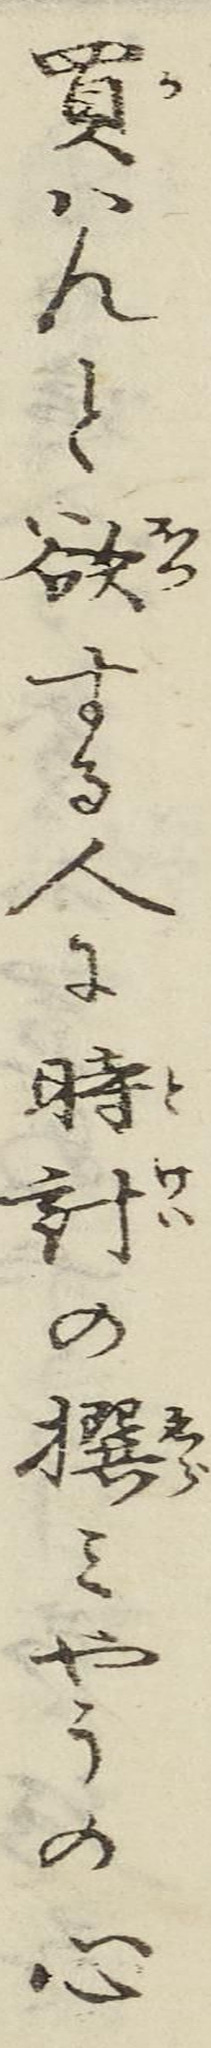買はんと欲する人に時計の撰みやうの心
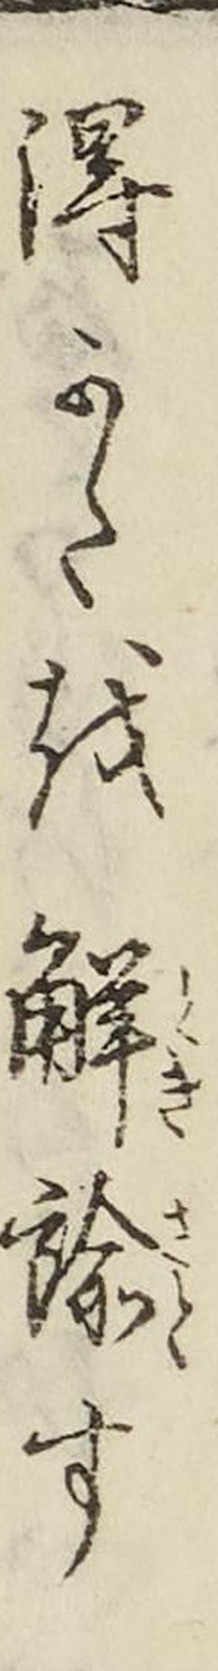得かたを解諭す
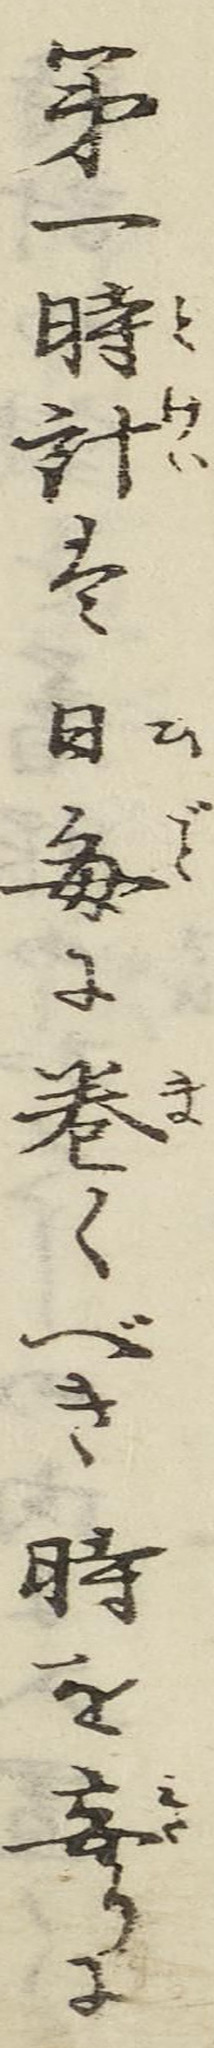第一時計は日毎に巻くべき時を妄りに
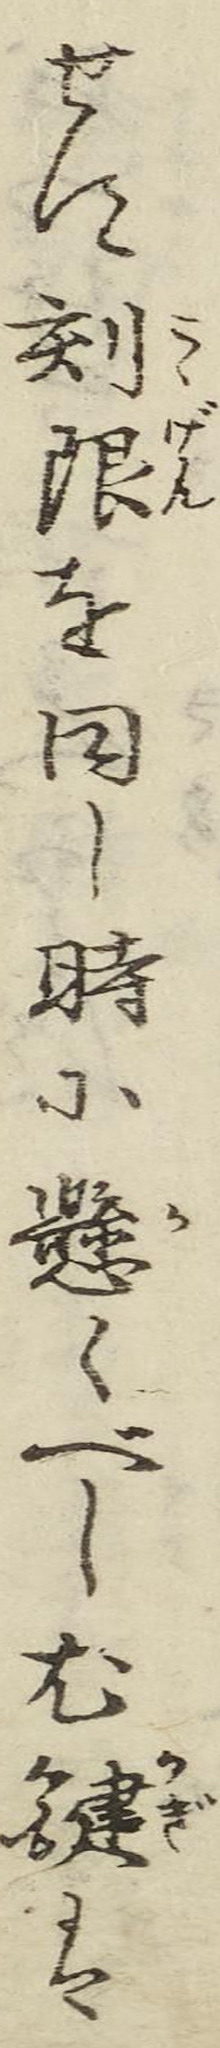せす刻限を同し時に懸くべし尤鍵は
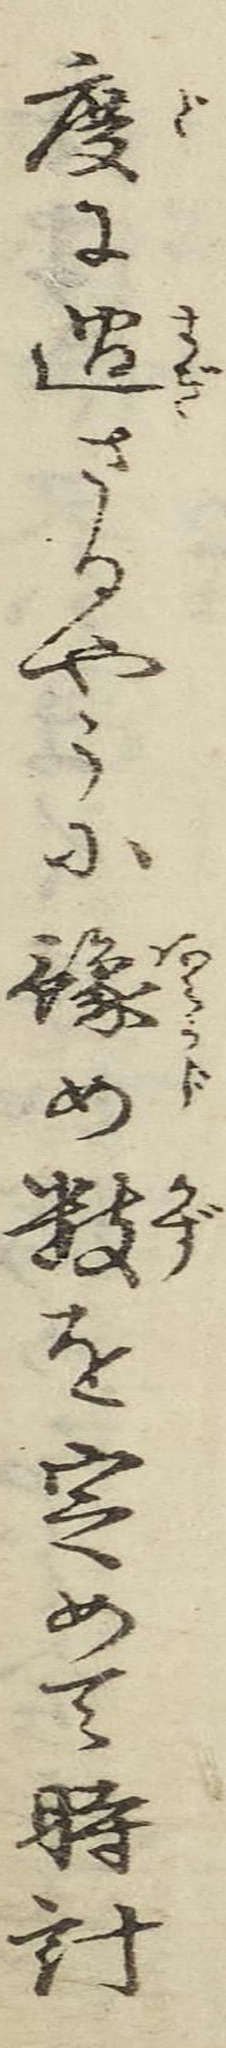度に過さるやうに豫め数を定めて時計

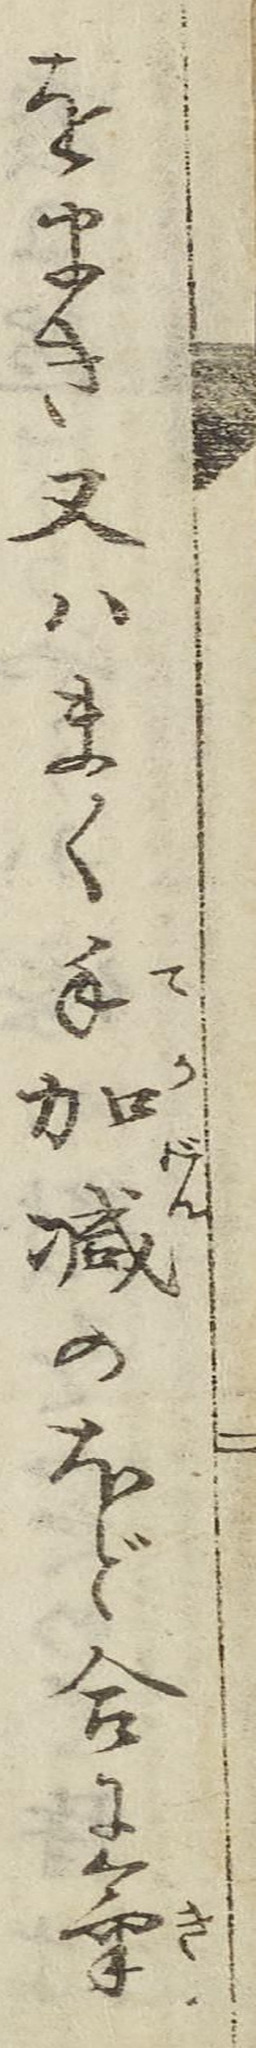をまき又はまく手加減のほど合に気
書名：[時計に関する冊子]
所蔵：東京大学地震研究所図書室 Earthquake Research Institute Library, The University of Tokyo, JAPAN
